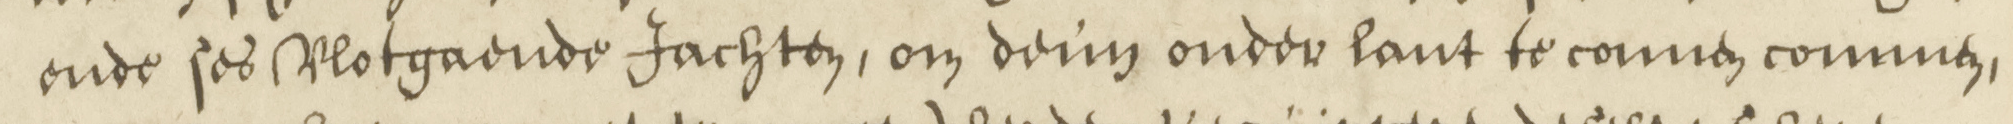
ende ses Vlotgaende Jachten, om deun onder lant te connen commen,
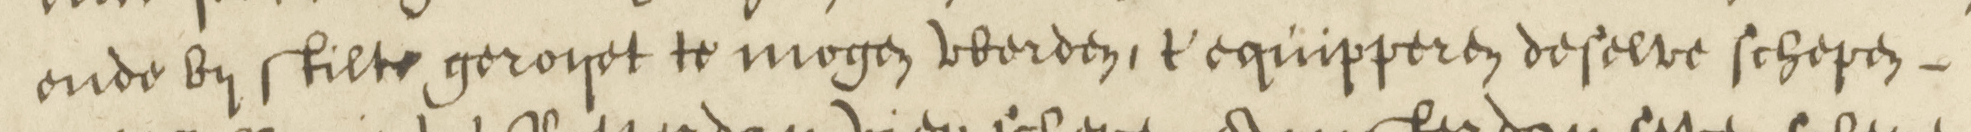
ende bij stilte geroyet te mogen werden, t'equipperen deselve schepen -
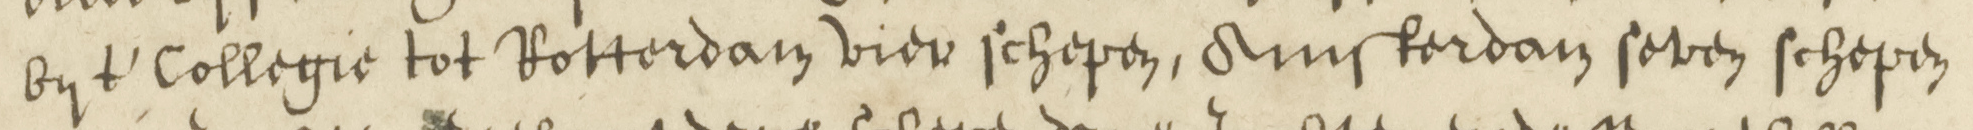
by t'Collegie tot Rotterdam vier schepen, Amsterdam seven schepen
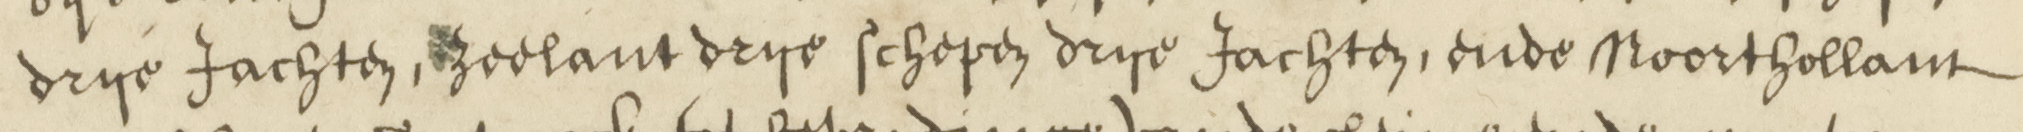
drye Jachten, Zeelant drye schepen drye Jachten, ende Noorthollant
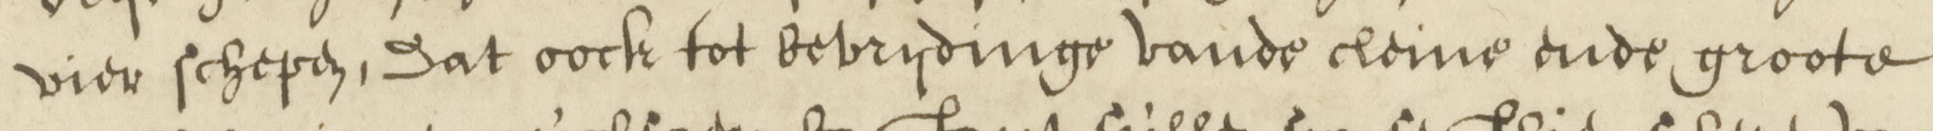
vier schepen. Dat oock tot bevrydinge vande cleine ende groote
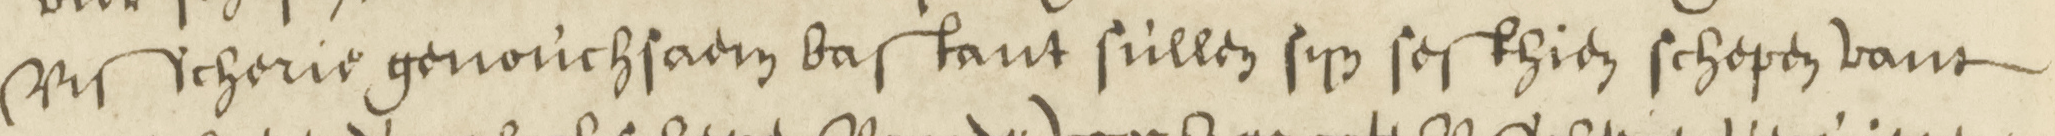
visscherie genouchsaem bastant sullen syn sesthien schepen vant
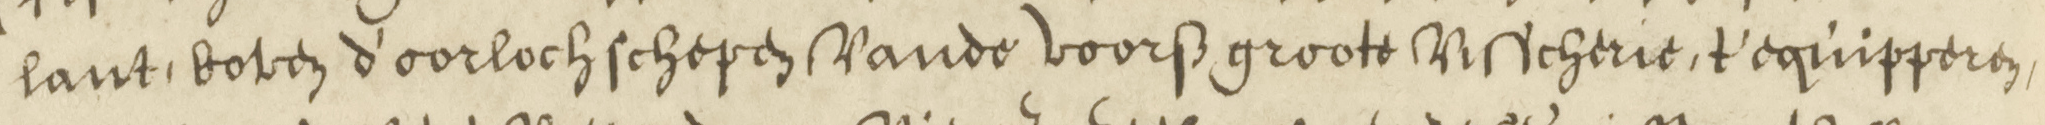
lant, boven d'oorlochschepen Vande voors groote visscherie, t'equipperen
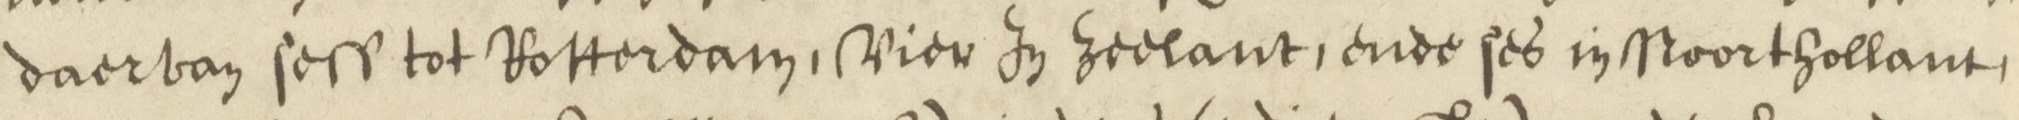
daervan sess tot Rotterdam, Vier in zeelant, ende ses in Noorthollant.
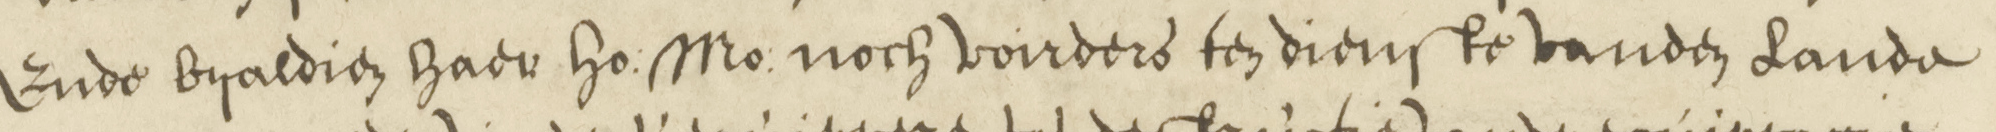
Ende byaldien haer Ho:Mo: noch voirders ten dienste vanden Lande
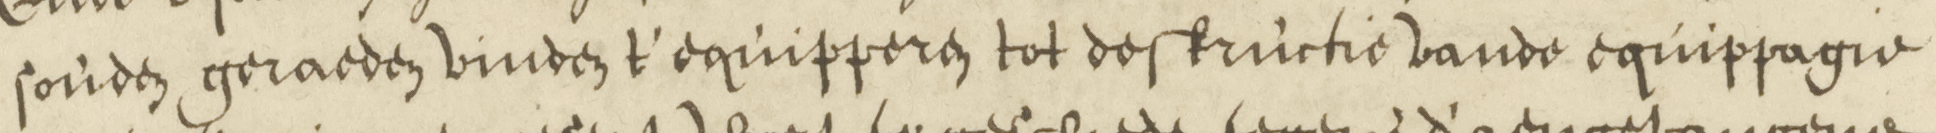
souden geraeden vinden t'equipperen tot destructie vande equippagie
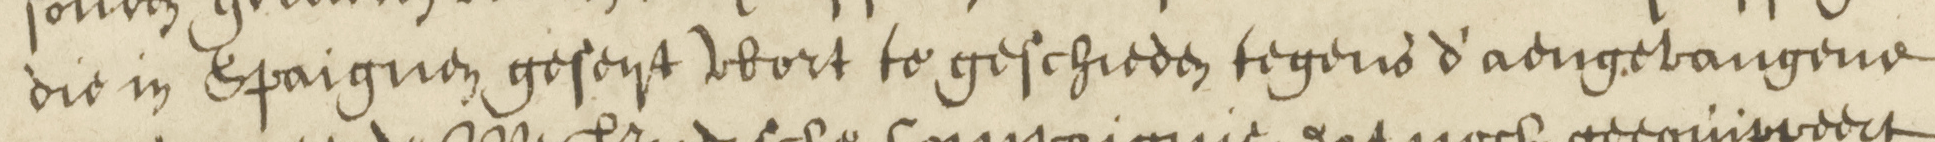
die in Spaignen geseyt wort te geschieden tegens d'aengevangene
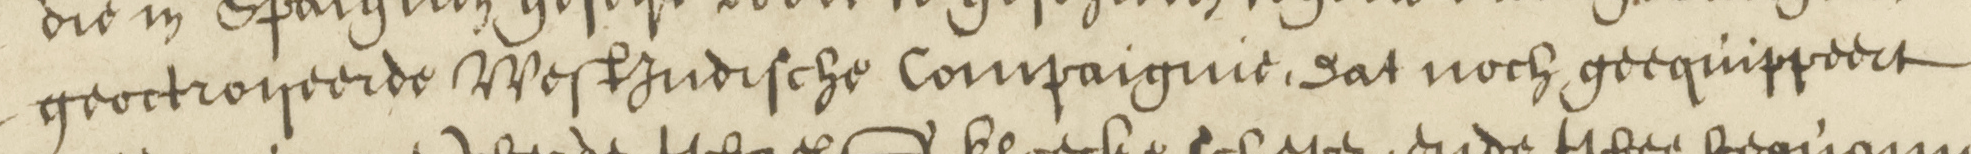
geoctroyeerde WestIndische Compaignie, dat noch geequippeert
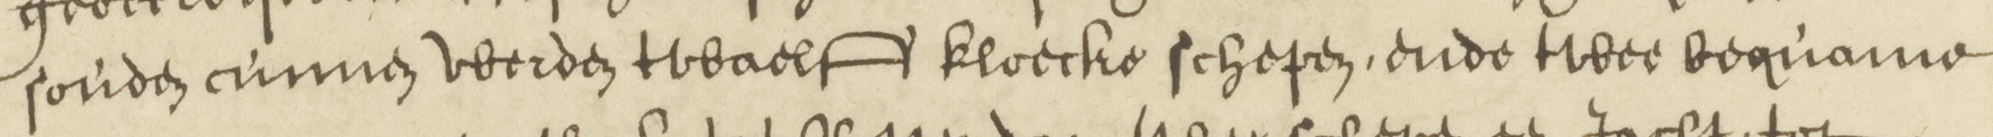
souden cunnen werden twaelff kloecke schepen, ende twee bequame
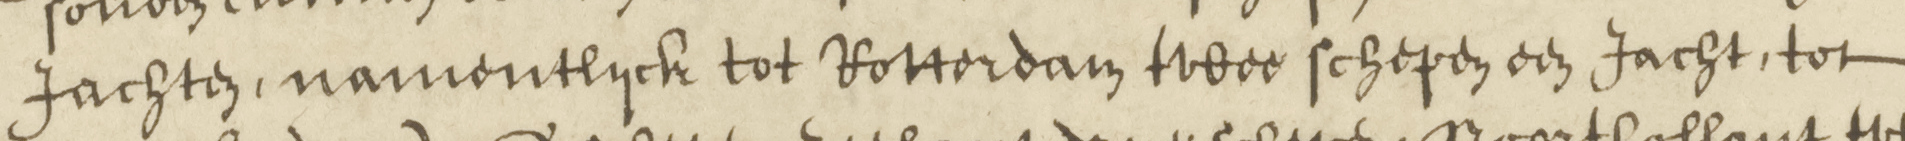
Jachten, namentlyck tot Rotterdam twee schepen een Jacht, tot
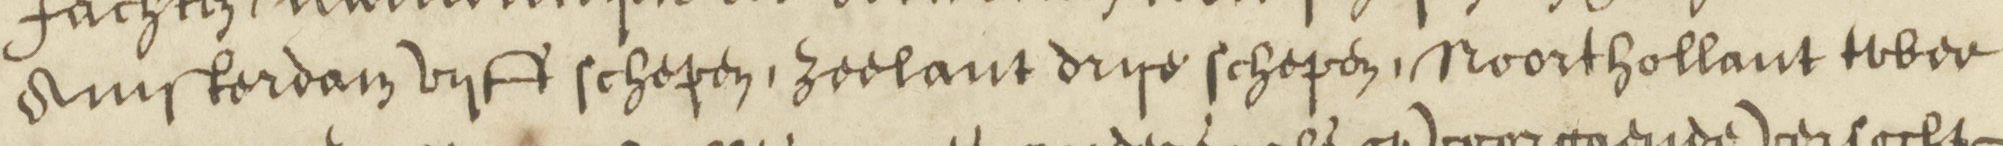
Amsterdam vyff schepen, Zeelant drye schepen, Noorthollant twee
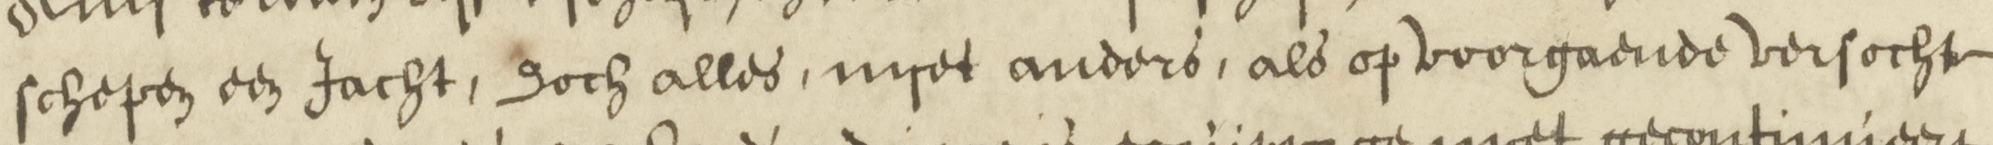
schepen een Jacht. Doch alles, nyet anders, als op voorgaende versocht
